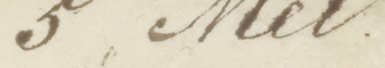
5 Mei.
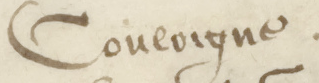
Couloigne.
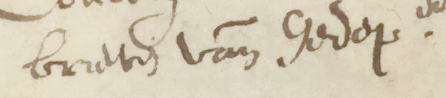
brieven van Gedepden.
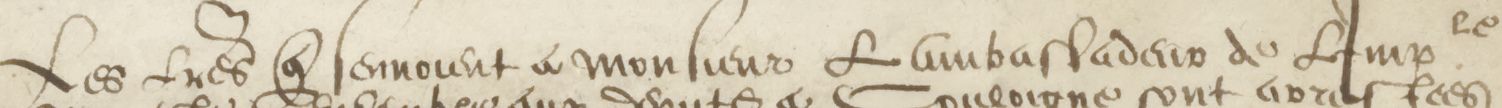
Les lres ca. seruoient a monsieur lambassadeur de lImp. le
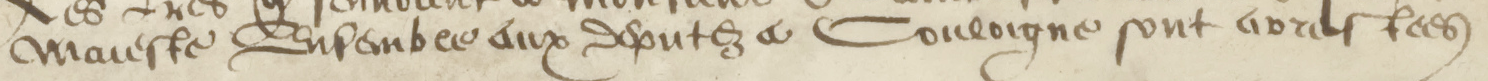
maieste ensemble aux Deputez a Couloigne sont arrestees.
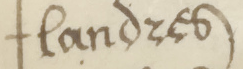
Flandres.
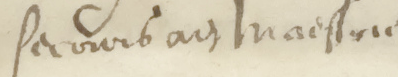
secours aen Maestricht
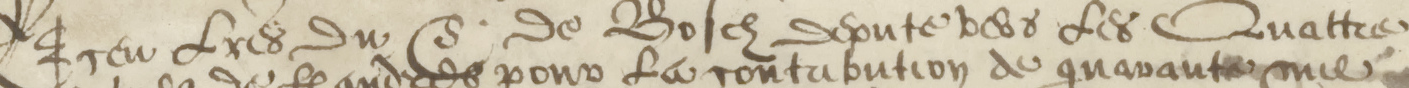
Receu lres du Sr. de Bosch depute vers les Quattre
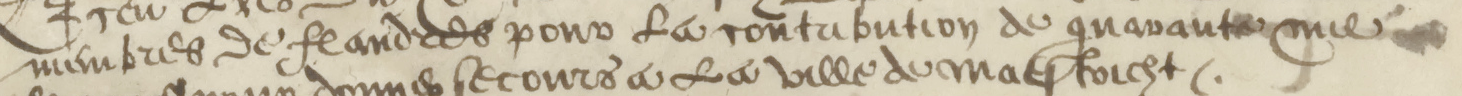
membres de flandres pour la contibution de quarante mil
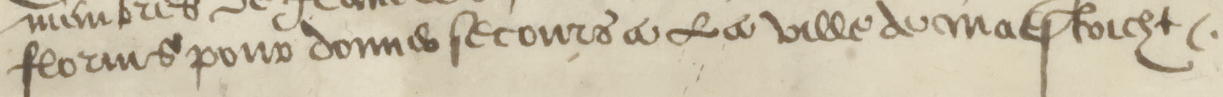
florins pour donner secours a la ville de maestricht.
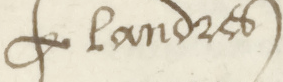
Flandres.
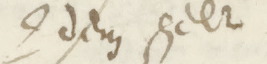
Idem gelt
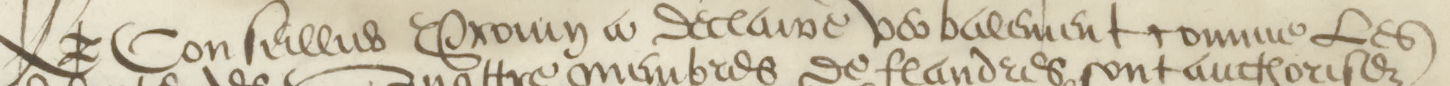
Le Conseillier Proun a declaire verbalement comme les
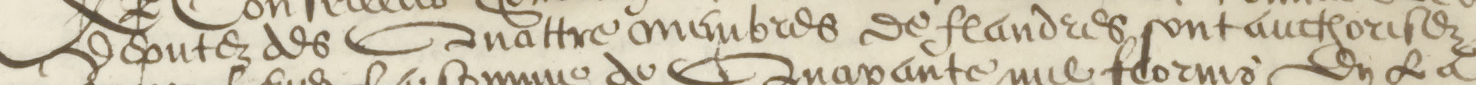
Deputez des Quattre membres de flandres sont aucthorisez
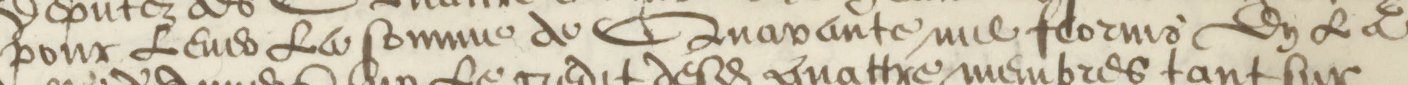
pour leuer la somme de Quarante mil florins en la
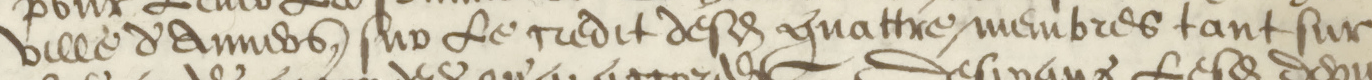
ville d'Anuers, sur le credit desd quattre membres tant sur
